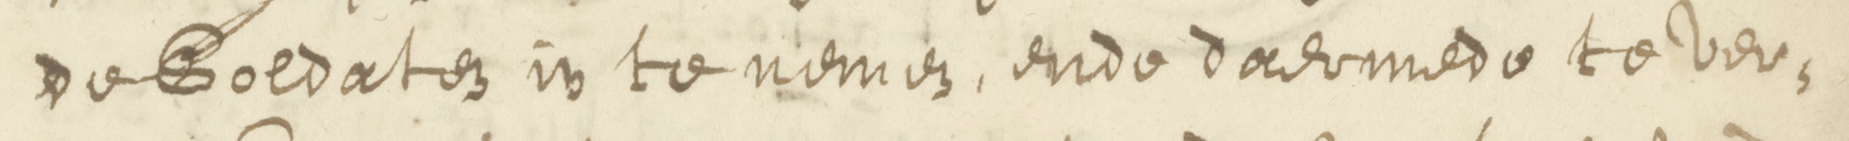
de Soldaten in te nemen, ende daermede te ver„
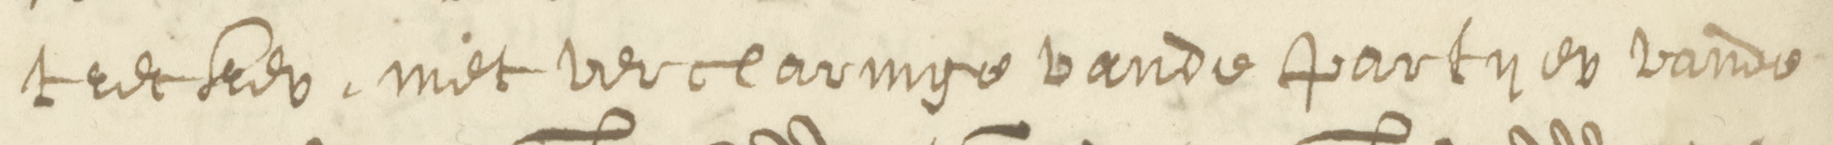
trecken, met verclaringe vande partyen vande
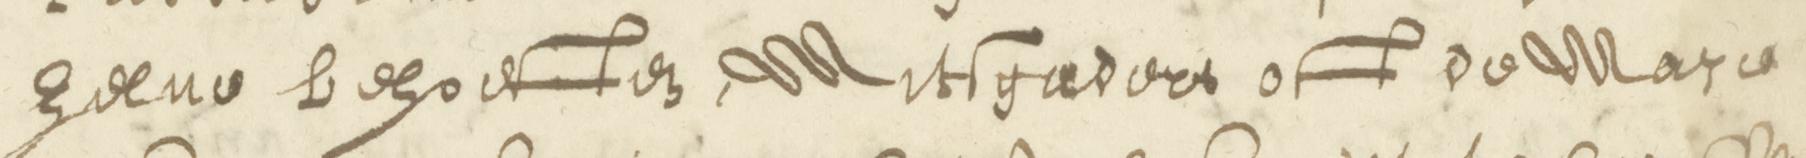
zelue behoeften, Mitsgaders off de Mare
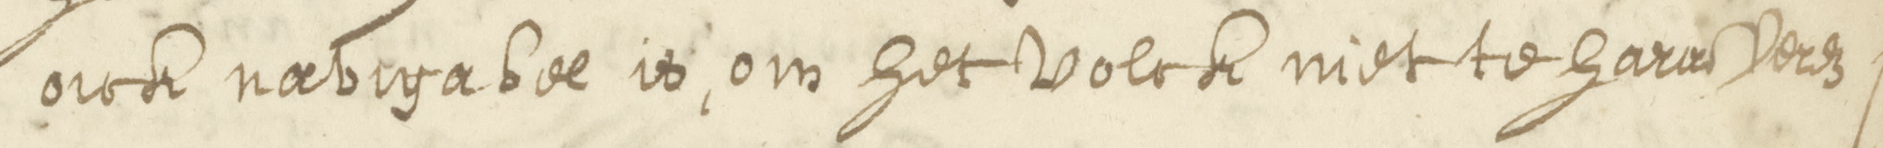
oick navigabel is, om het volck niet te harasseren.
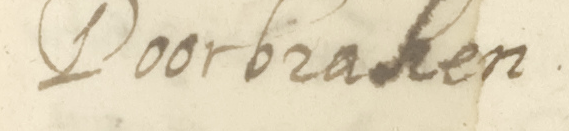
Doorbraken.
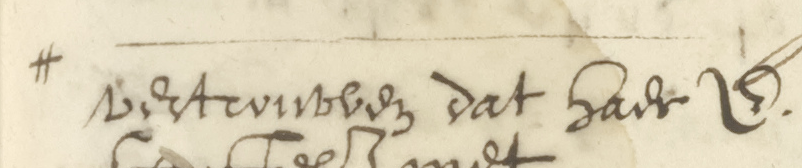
#vertrouwen dat haer E.
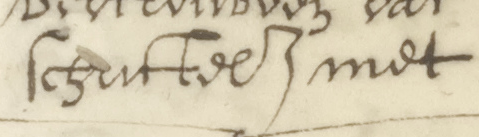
schriftel met
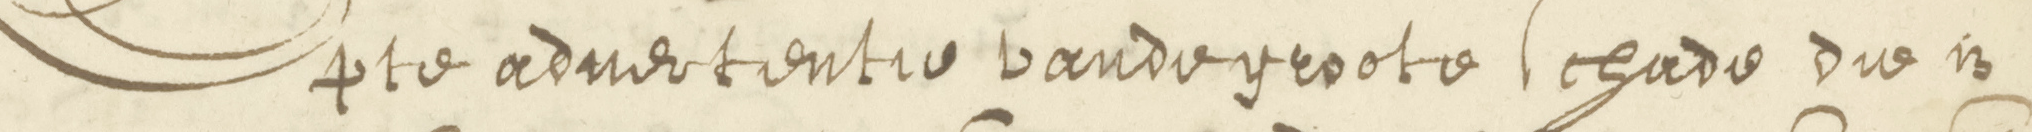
Opte advertentie vande groote Schade die in
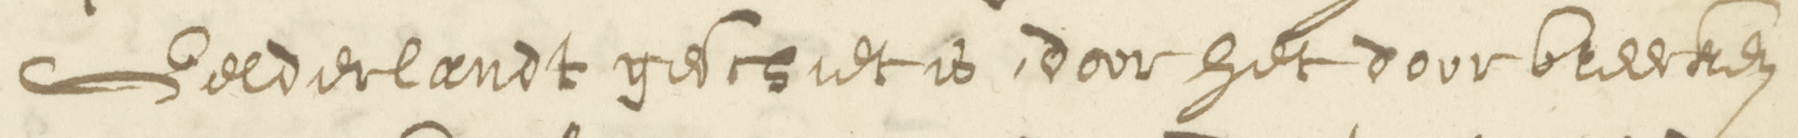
Gelderlandt geschiet is, door het doorbreecken
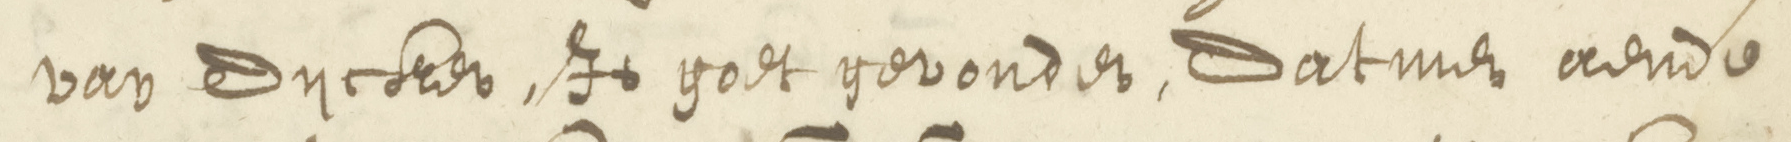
van Dycken, Is goet gevonden, Datmen aende
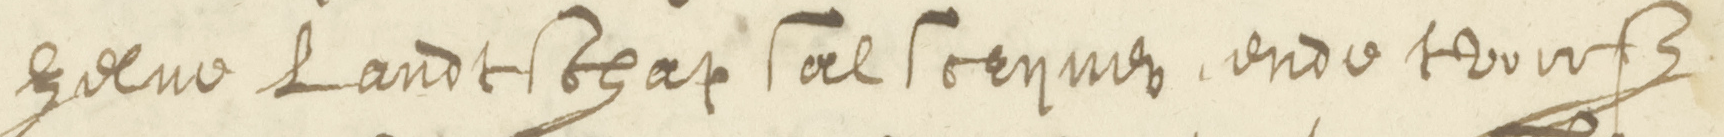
zelve Landtschap sal scryuen, ende tvoirs
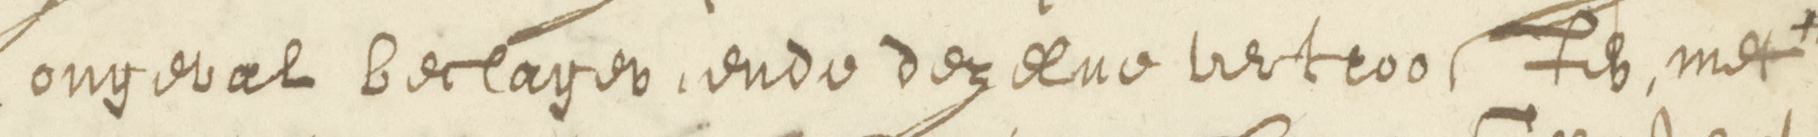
ongeual beclagen, ende dezelue vertroosten met#
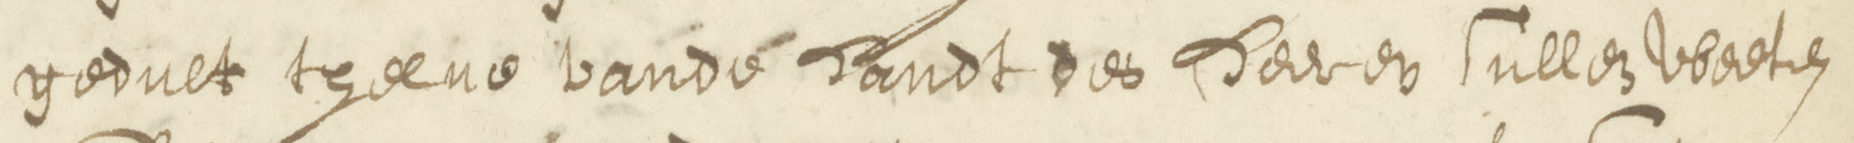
gedult tzelue vande handt des heeren sullen weeten
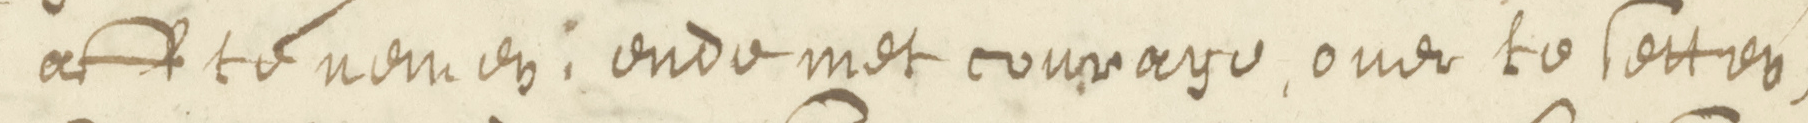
aff te nemen, ende met courage ouer te setten,
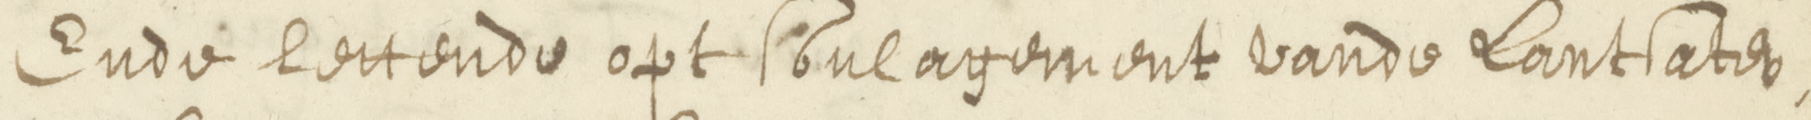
Ende lettende opt soulagement vande Lantsaten,
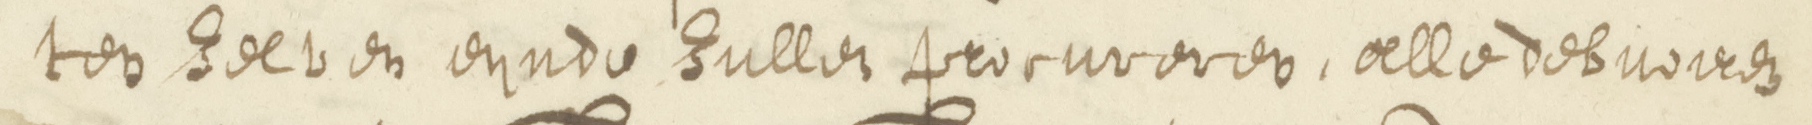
ten zelven eynde zullen procureren, alle debuoiren
